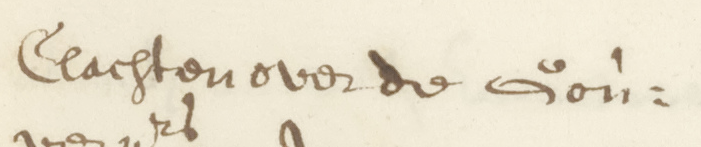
Clachten over de Gou„
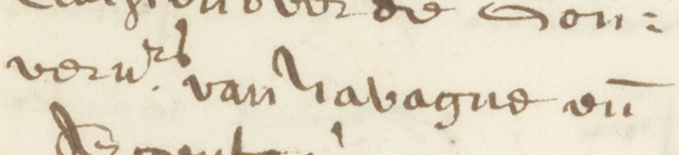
verners. van Navagne en
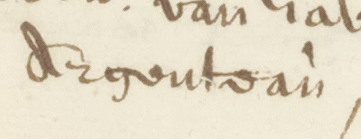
Argenteau
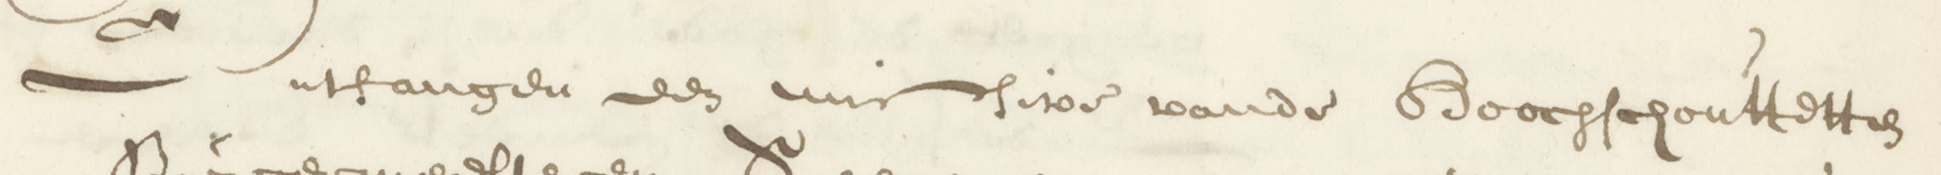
Ontfangen een missive vande Hoochschouttetten
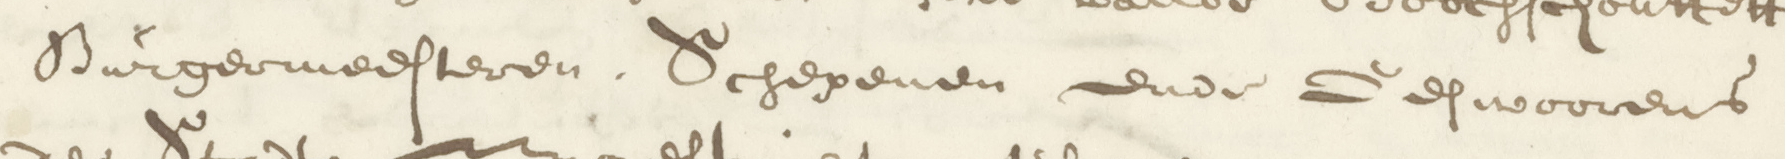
Burgermeesteren, Schepenen ende Geswoorens
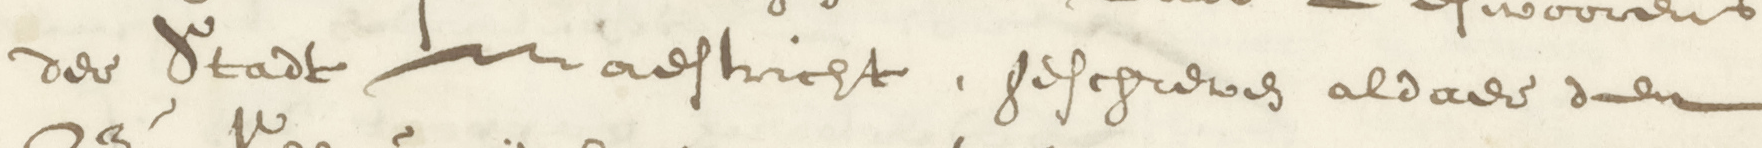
der Stadt Maestricht, geschreven aldaer den
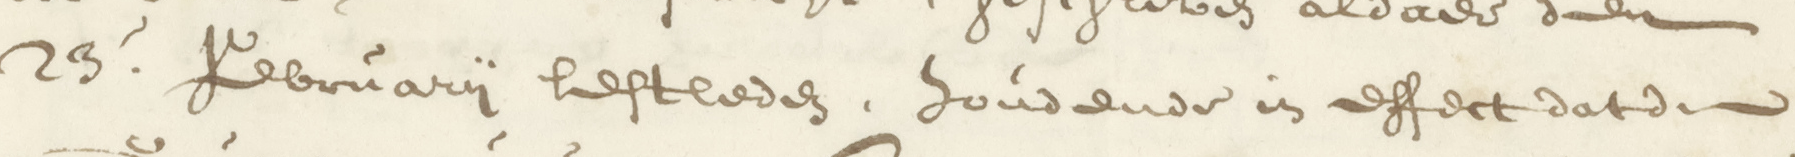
23e. Februarij lestleden, houdende in effect dat de
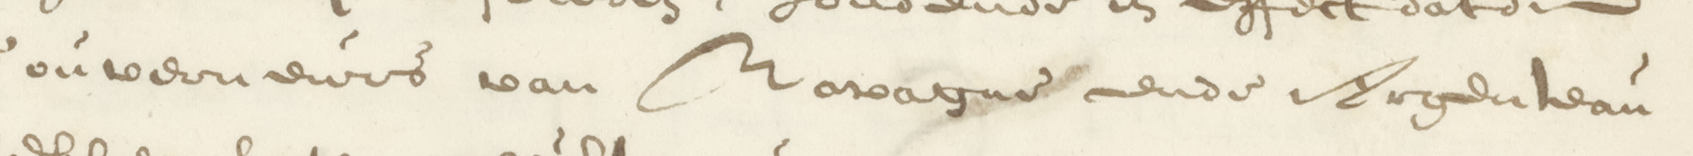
Gouverneurs van Navagne ende Argenteau
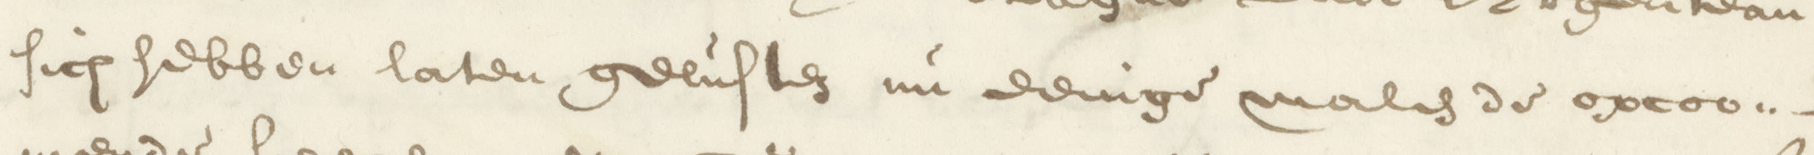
sich hebben laten gelusten nu eenige malen de opcoo„
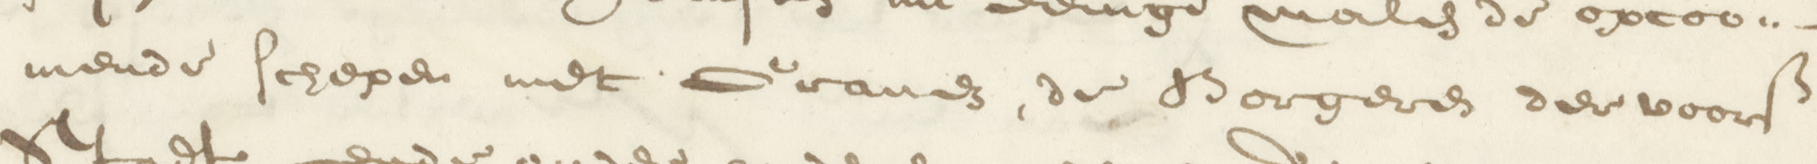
mende schepen met Granen, de Borgeren der voors
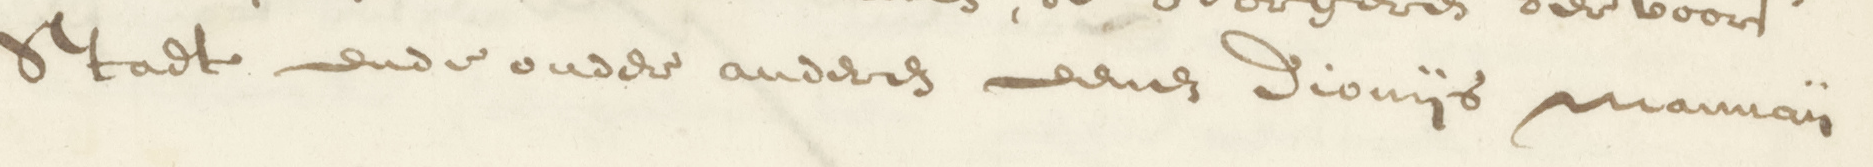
Staet ende onder anderen eenen Dionijs Mannaij
